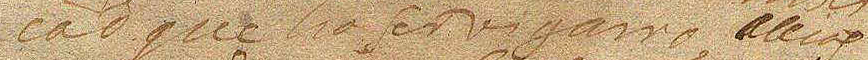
acaõ que ho sor̄ vigairo allias
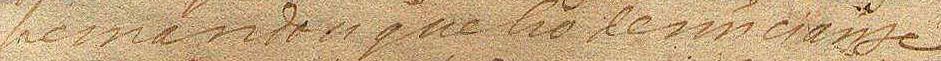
he mandou que ho denūciante
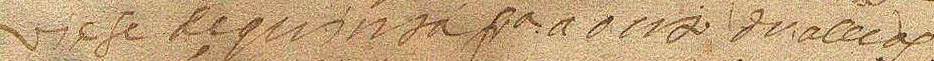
viese de quinta fra. a outo di allias
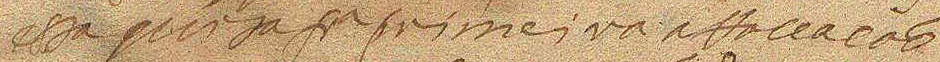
esta quīta fra primeira a Rollacaõ
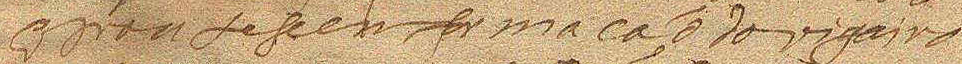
& trouxese enformacaõ do vigairo
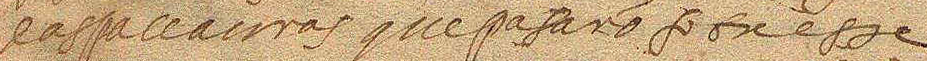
das pallauras que pasarō sobre este
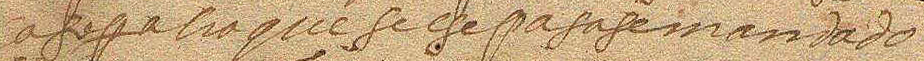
caso ꝑa ho que se lhe pasase mandado
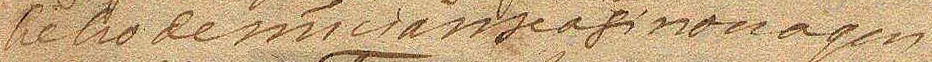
he ho denūciante asinou aqui
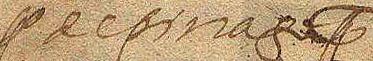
po de pina ho sp̄
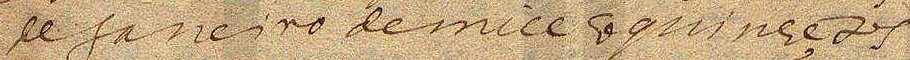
de Janeiro de mill & quinhētos
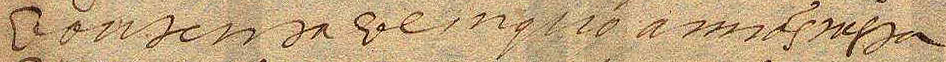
& outenta & cinquo annos̄ nesta
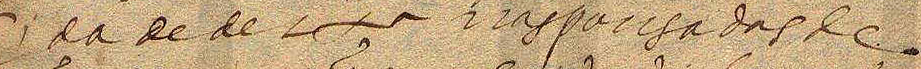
Cidade de Lxa nas pousadas de
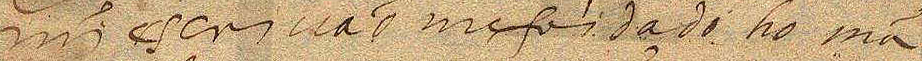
mī escriuaõ me foi dado ho mā
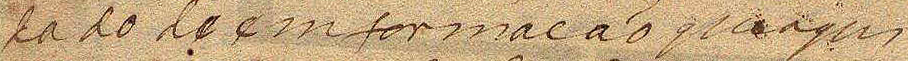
dado de emformacaõ que aqui
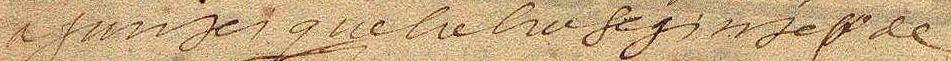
aJuntei que he ho seginte po de
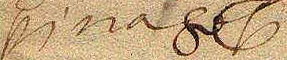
pina ho sp̄
